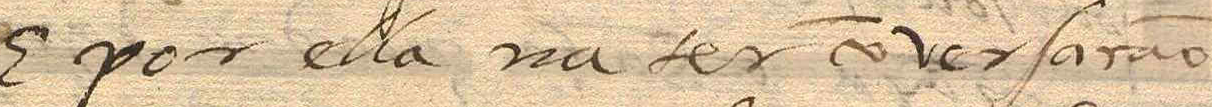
E por ella na ter cōversação
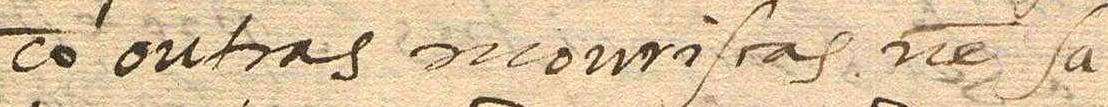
cō outras mouriscas nē sa
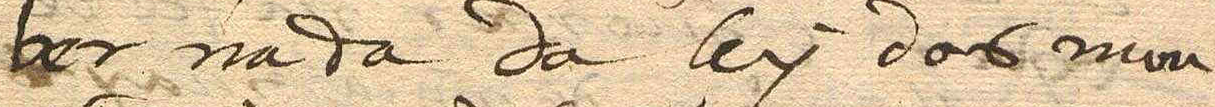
ber nada da ley dos mou
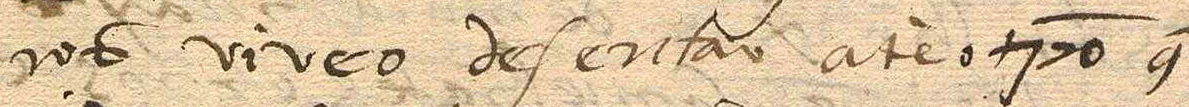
ros viveo des então ate o tp̄o q̄
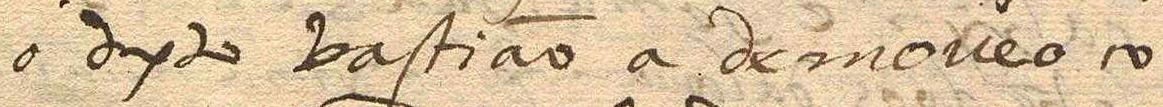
o dyto bastião a demoveo co
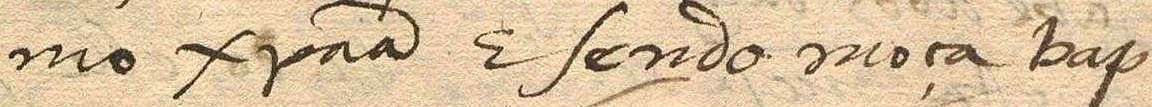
mo xpāa E sendo moça bap
